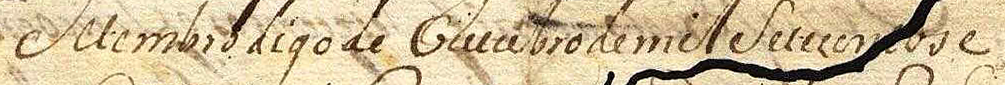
Setembro digo de Outubro de mil Setecen_os e
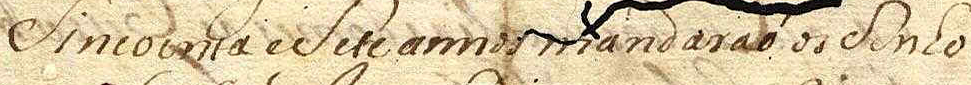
Sincoenta e Sete annos mandaraõ os Senho
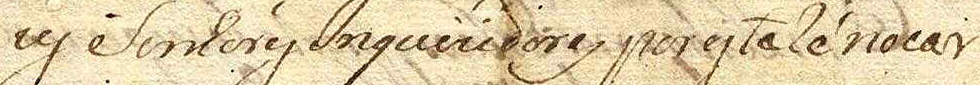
res Senhores Inquizidores por esta Ré no car
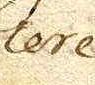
cere
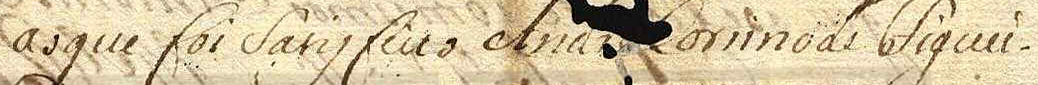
ao que foi Satisfeito Andre Corsino de Figuei
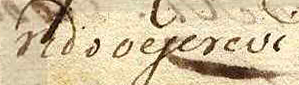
redo o escrevi
